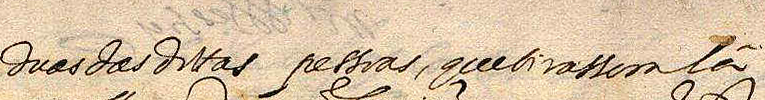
duas das dittas pessoas, que tirassem lá
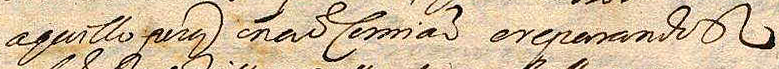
aquillo porq̄ o naõ Comiaõ, e reparando R
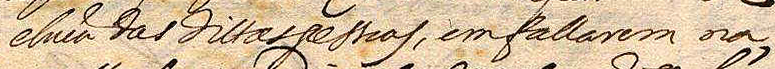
e huã das dittas pessoas, em fallarem na
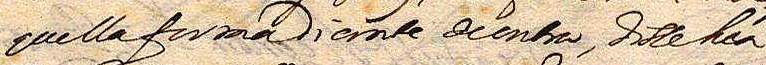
quella forma diante de outra, disse huã
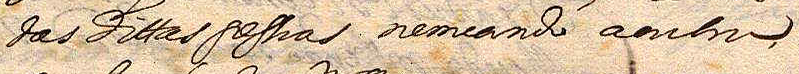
das dittas pessoas, nomeando a outra
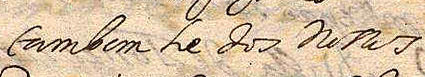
tambem he dos nossos
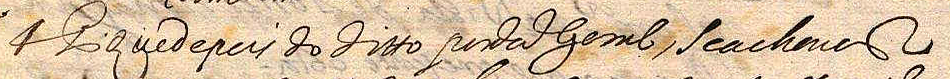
4 P. Que depois do ditto perdaõ Geral, se achauaõ
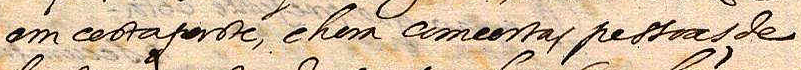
em certa parte, e hora com certas pessoas de
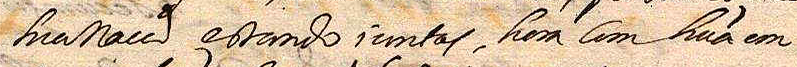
sua naçaõ estando iuntas, hora com huã em
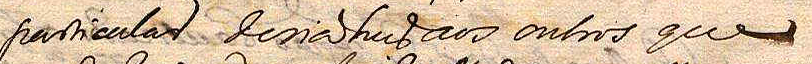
particular deraõ hus̄ aos outros que
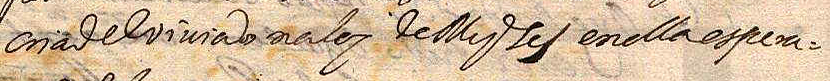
criaõ e viuiaõ na lej de Moyses e nella espera
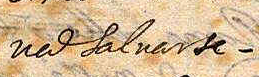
uaõ saluarse.
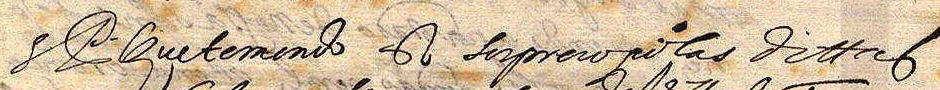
8 P. Que temendo o R ser prezo polas dittas
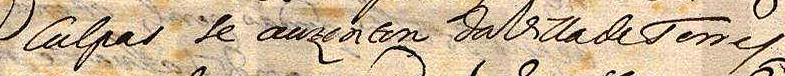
Culpas se auzenten da Villa de Torres
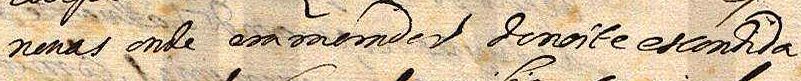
nouas onde era morador de noite escondida
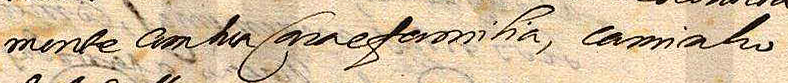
mente com sua Caza e familia, caminho
